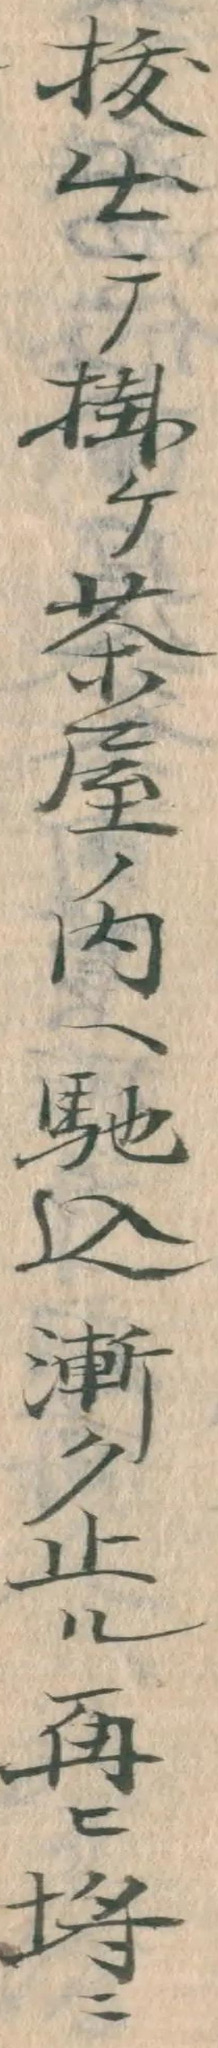抜出テ掛ケ茶屋ノ内ヘ馳込漸ク止ル再ヒ埒ニ
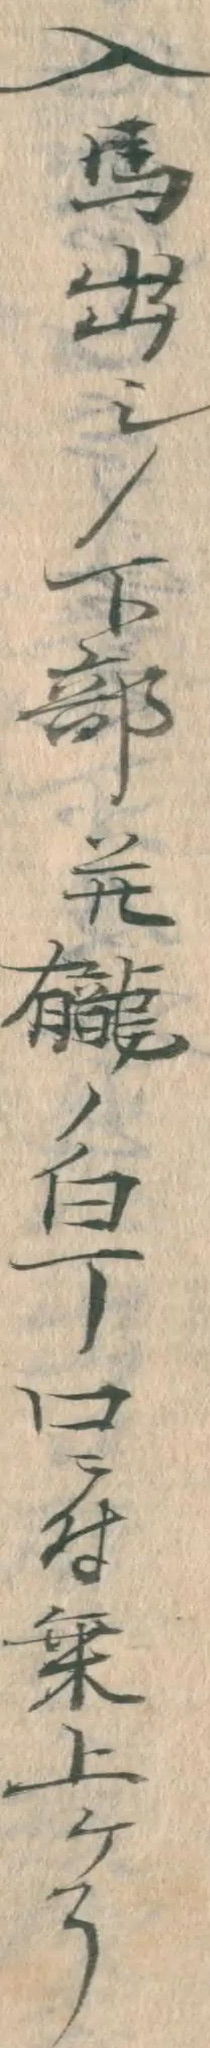入馬出シノ下部并龓ノ白丁口ニ付乗上ケ了
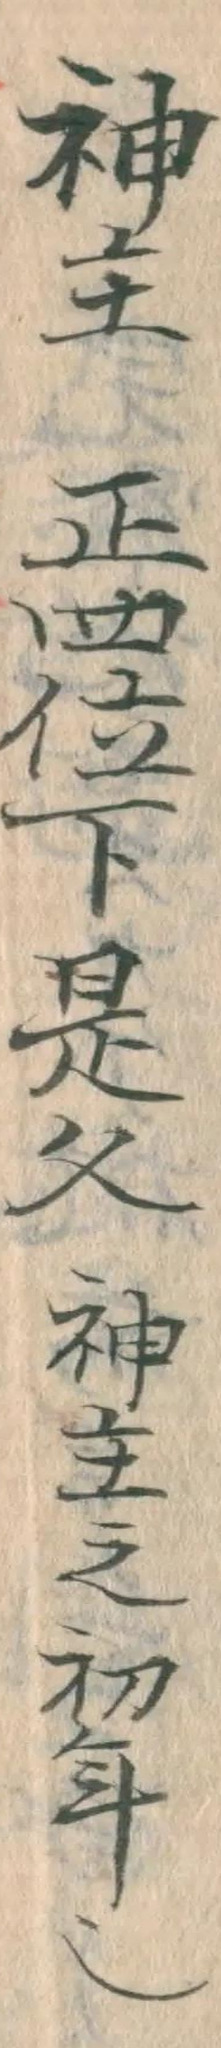神主正四位下是久神主之初年也
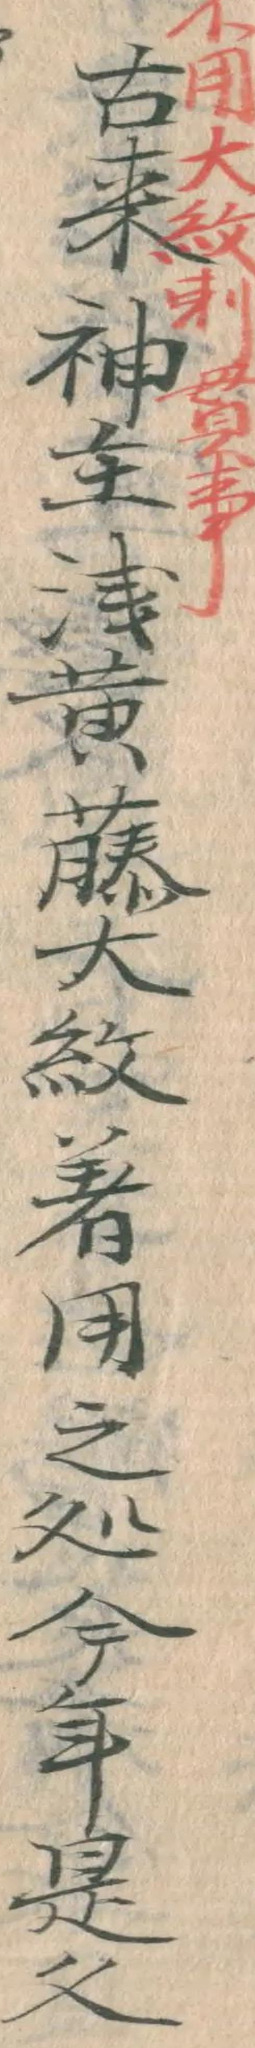古来神主浅黄藤大紋着用之処今年是久
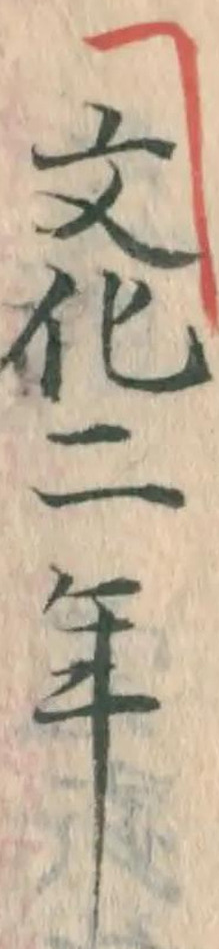文化二年

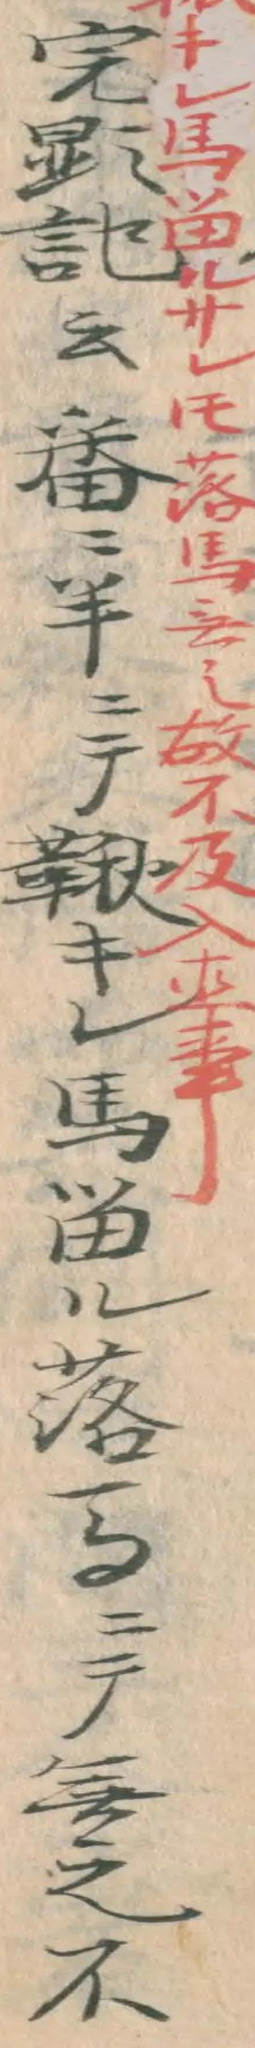完顕記云番ニ半ニテ鞦キレ馬留ル落馬ニテ無之不
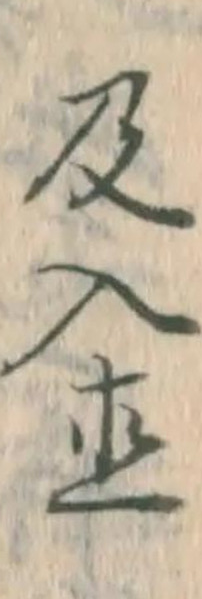及入直
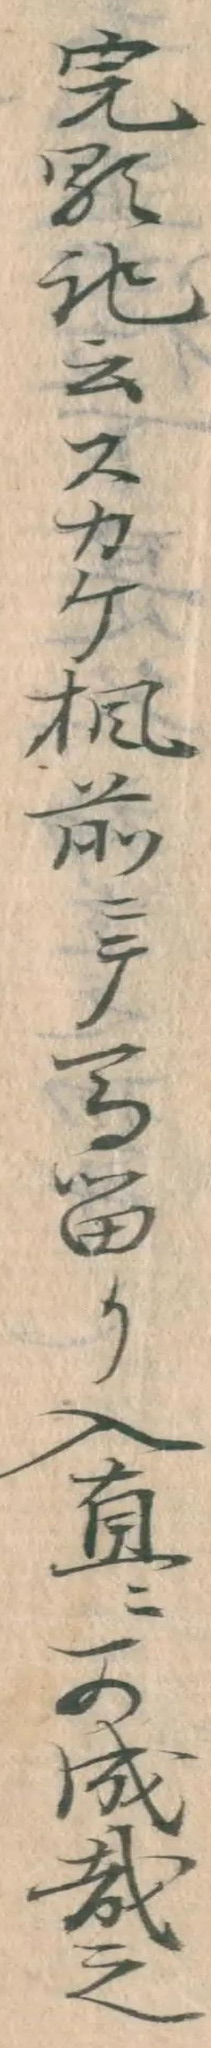完顕記云スカケ楓前ニテ馬留リ入直ニ可成哉之
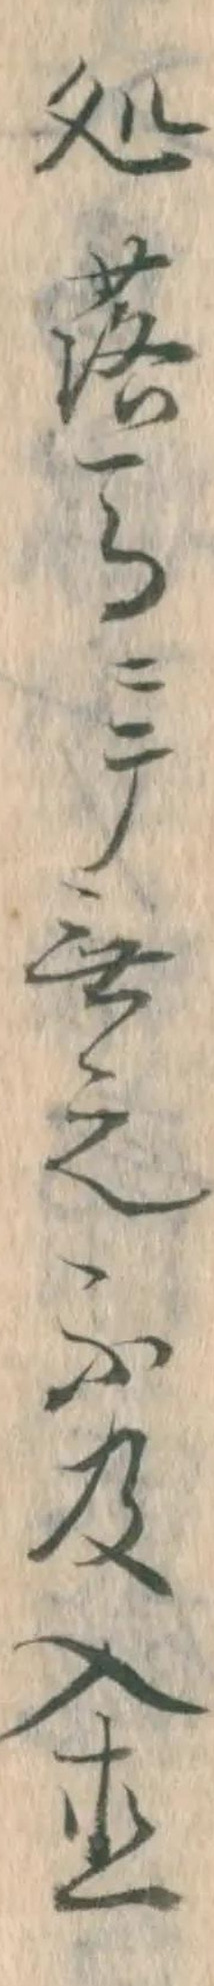処落馬ニテ無之不及入直
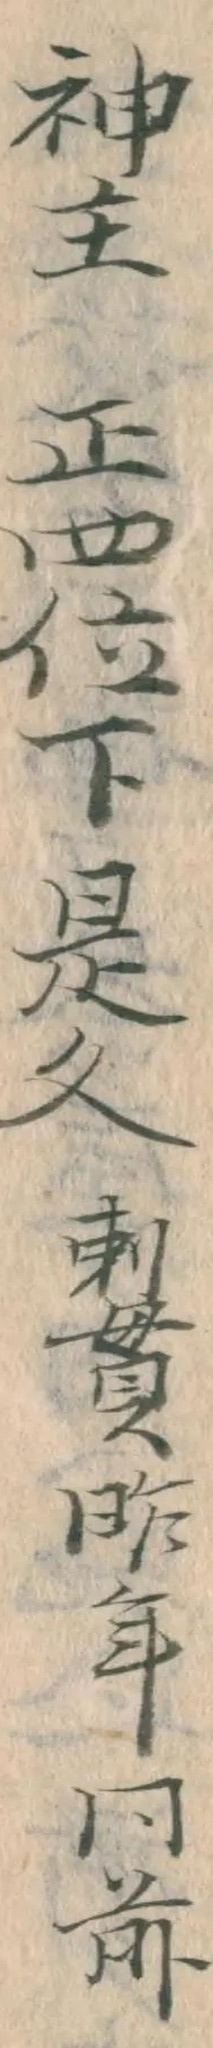神主正四位下是久刺貫昨年同前
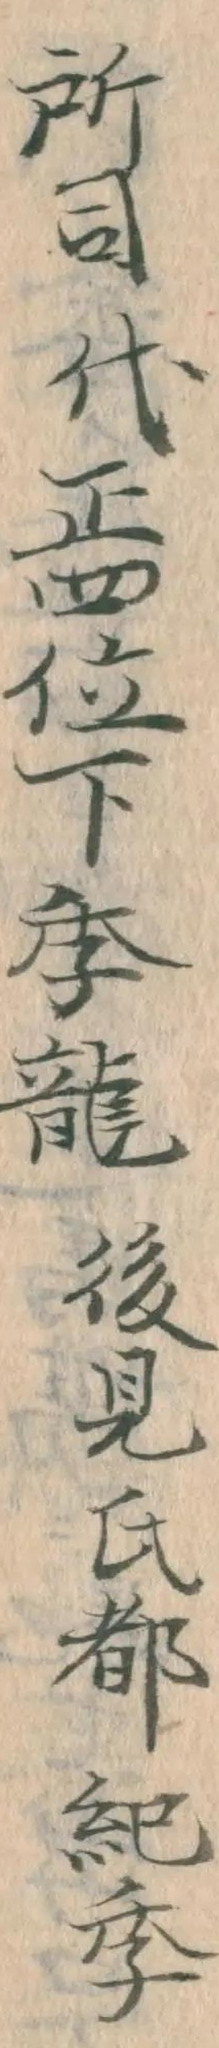所司代正四位下季龍後見氏都紀季
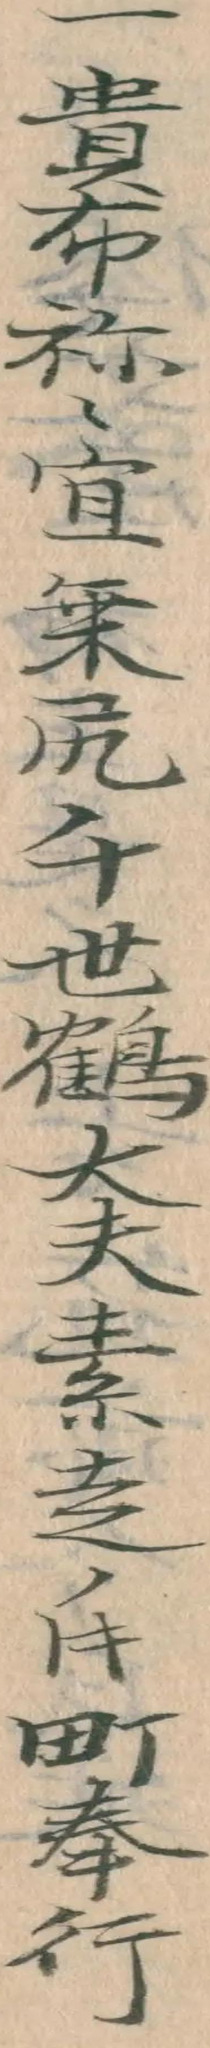一貴布祢々宜乗尻千世鶴大夫素走ノトキ町奉行
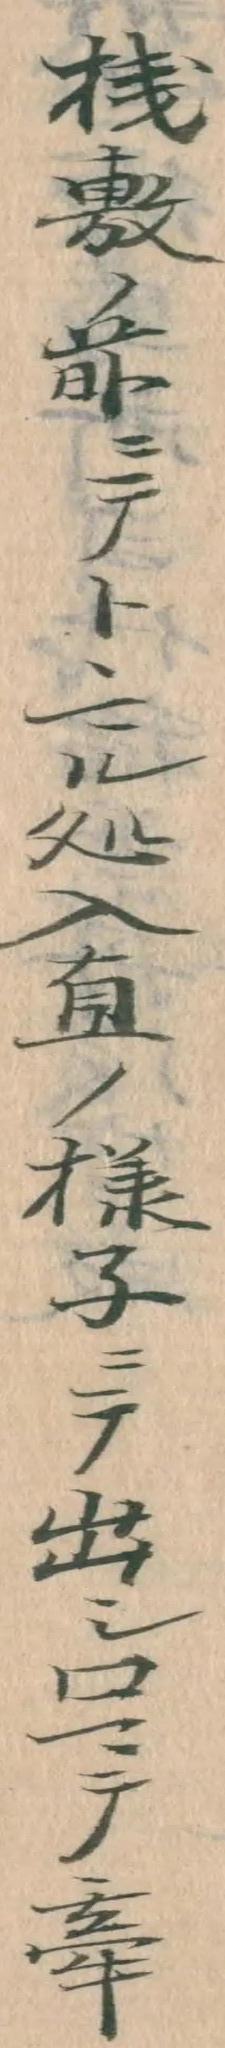桟敷ノ前ニテトヽマル処入直ノ様子ニテ出シ口マテ牽
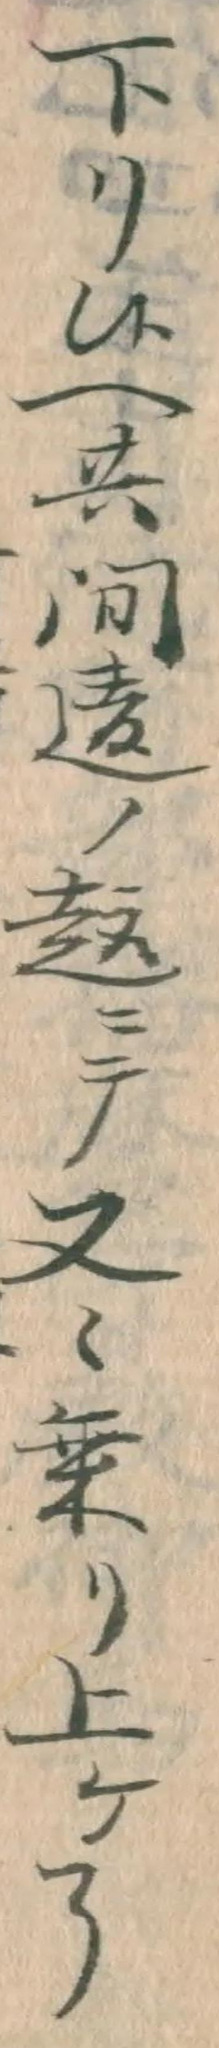下リ候へ共間違ノ趣ニテ又々乗リ上ケ了
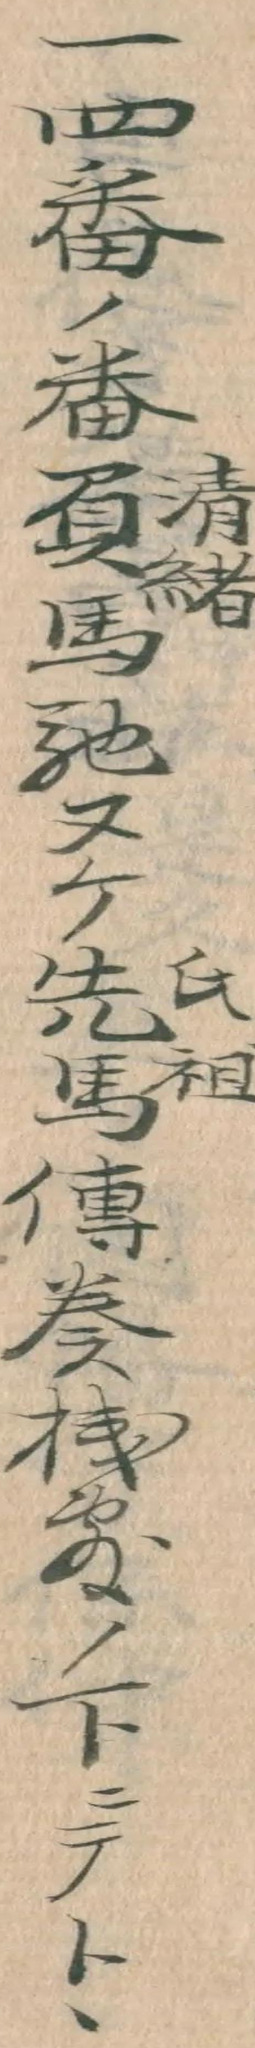一四番ノ番負馬馳ヌケ先馬伝奏桟敷ノ下ニテトヽ
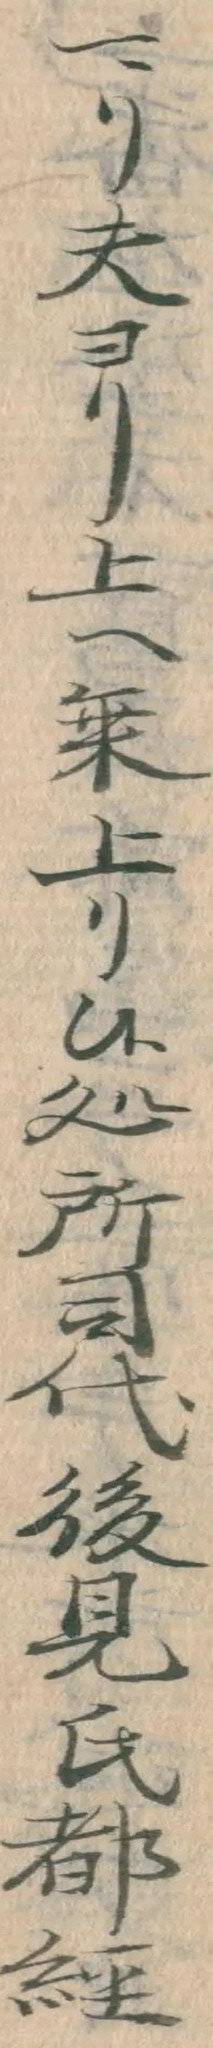マリ夫ヨリ上へ乗上リ候処所司代後見氏都経
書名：賀茂社記録. 第10冊
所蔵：国立国会図書館 National Diet Library, JAPAN
